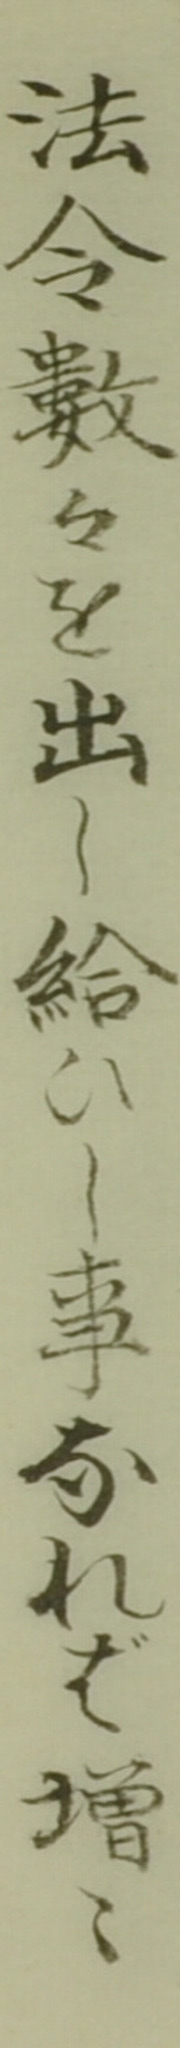法令数々を出し給ひし事なれば増々
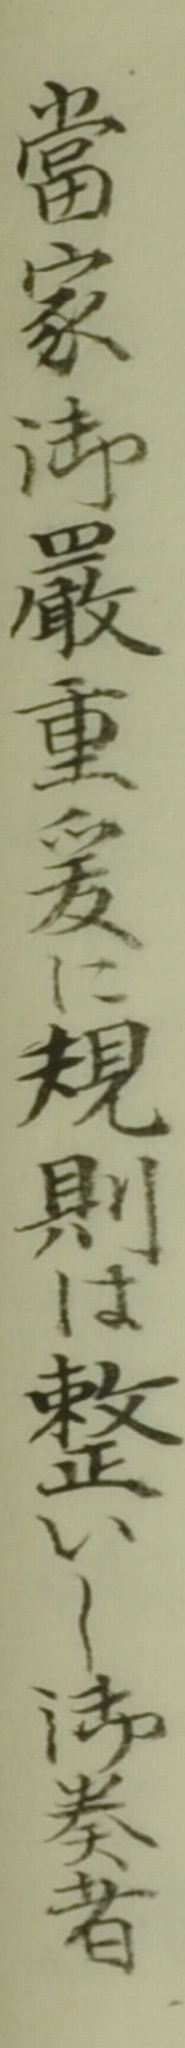当家御厳重爰に規則は整いし御奏者
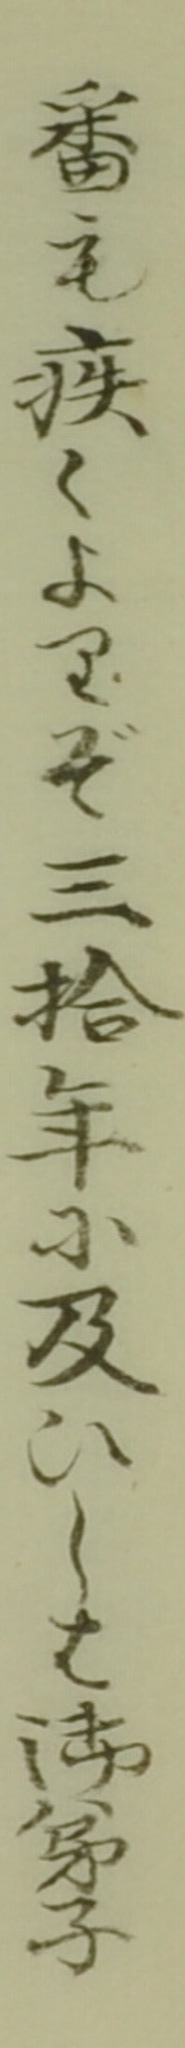番も疾くよりぞ三拾年に及ひしは御弟子
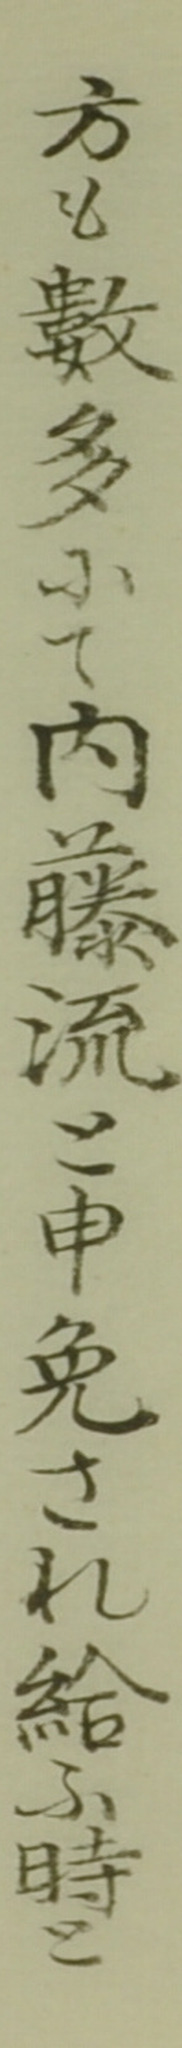方も数多にて内藤流と申めされ給ふ時と
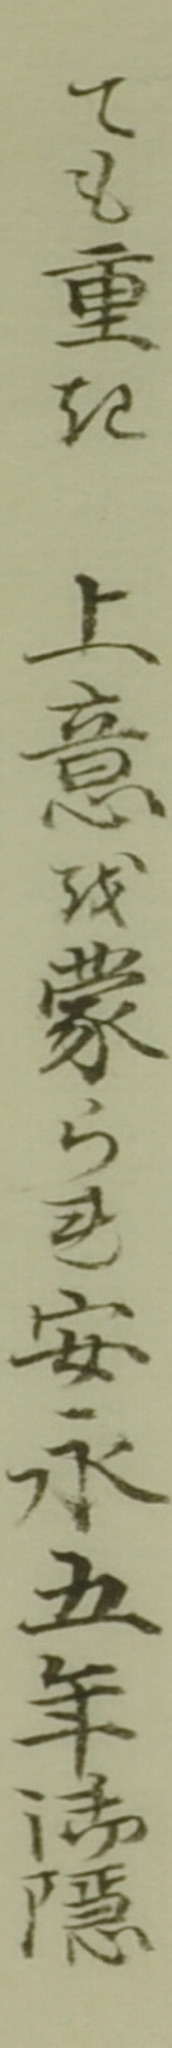ても重き上意を蒙られ安永五年御隠
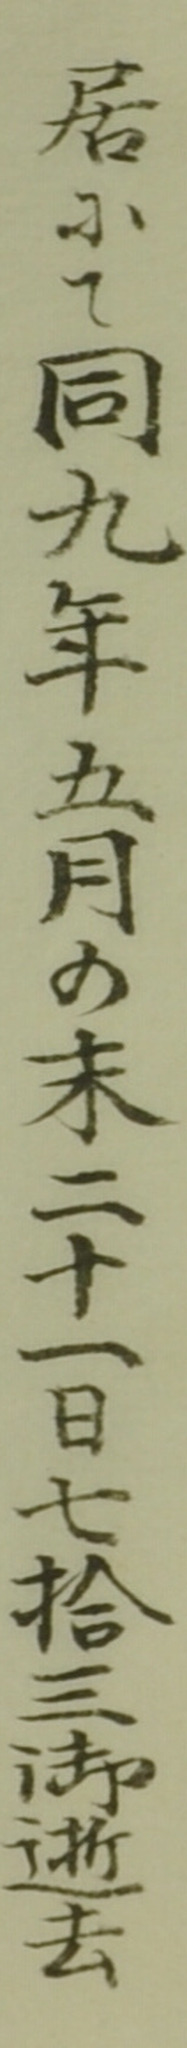居にて同九年五月の末二十一日七拾三御逝去
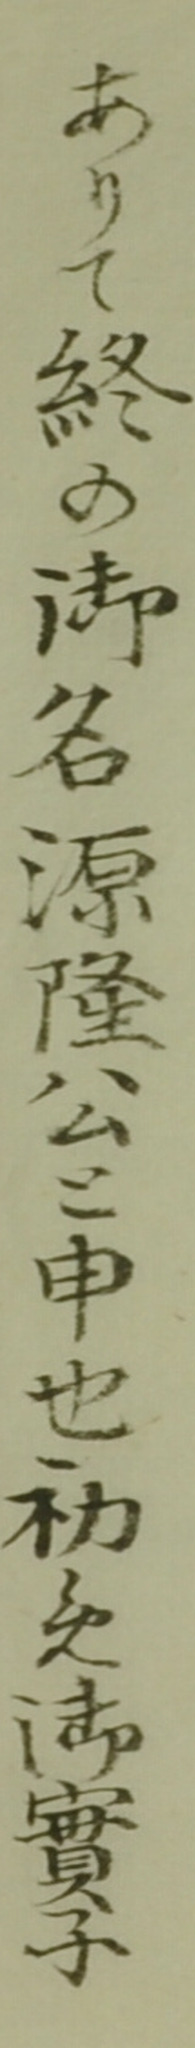ありて終の御名源隆公と申也初め御実子
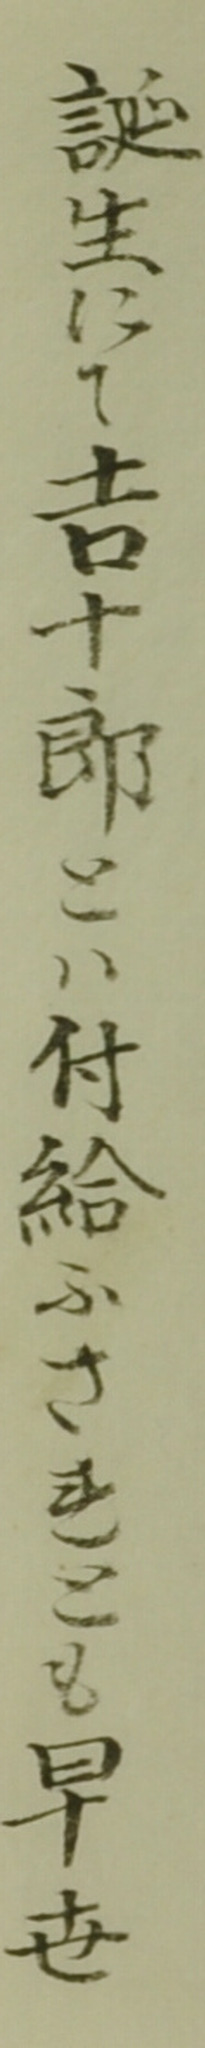誕生にて吉十郎とハ付給ふされとも早世

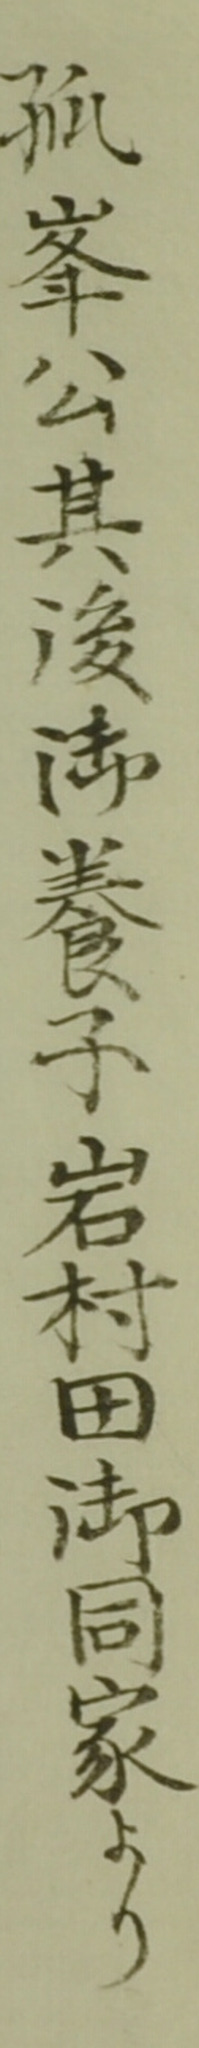孤峯公其後御養子岩村田御同家より
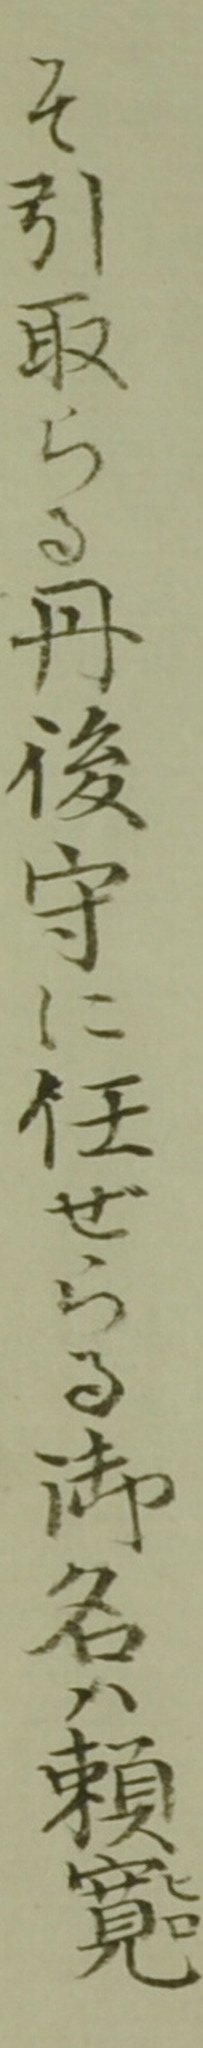そ引取らる丹後守に任ぜらる御名は頼寛
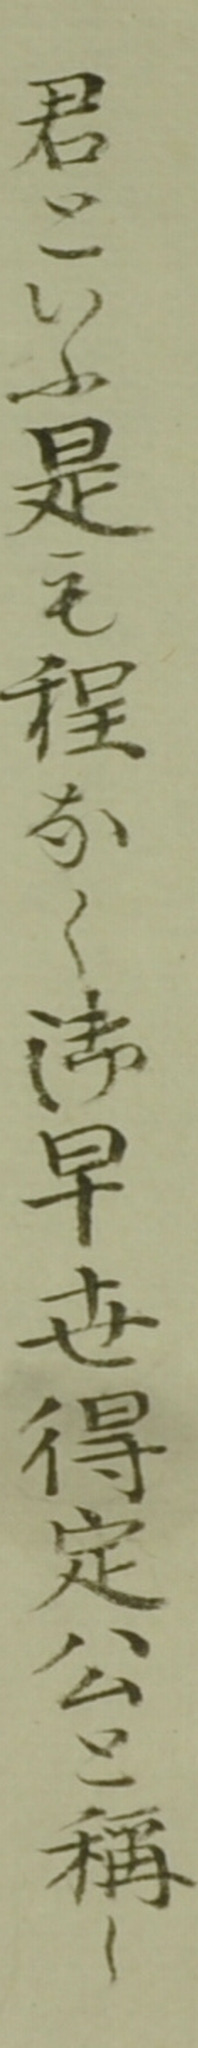君といふ是も程なく御早世得定公と称し
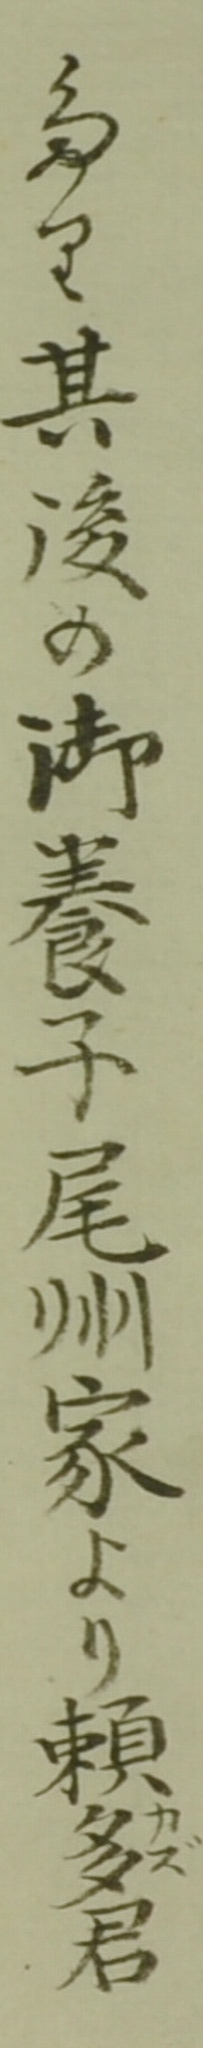たり其後の御養子尾州家より頼多君
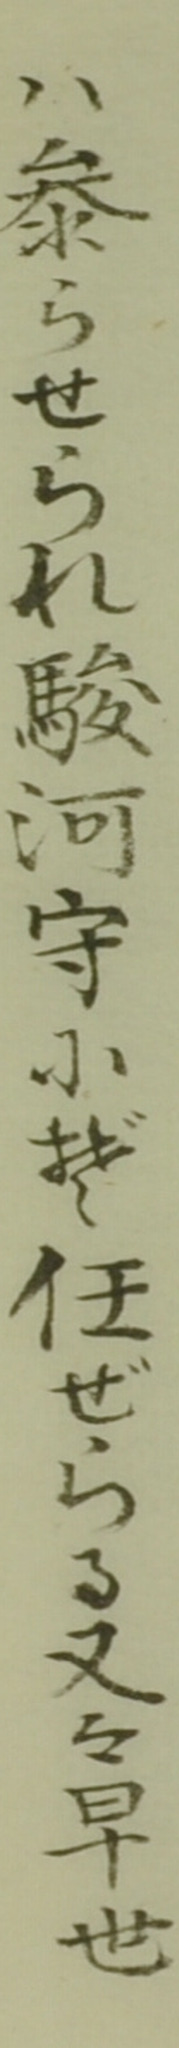は参らせられ駿河守にぞ任ぜらる又々早世
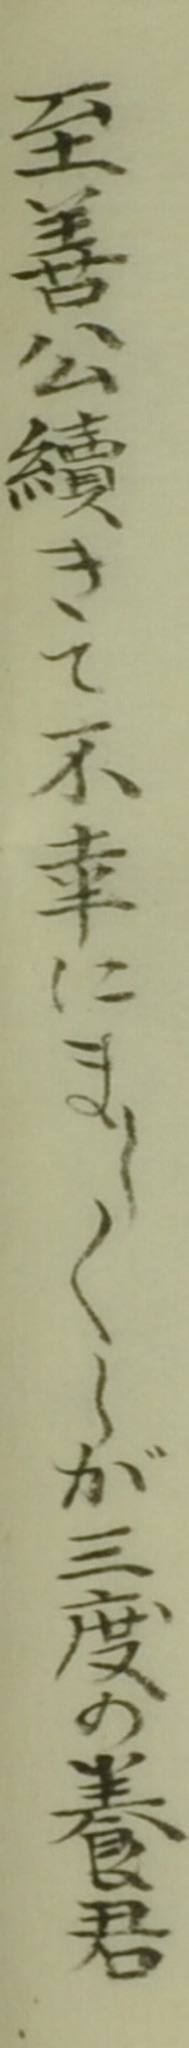至善公続きて不幸にまし〳〵しが三度の養君
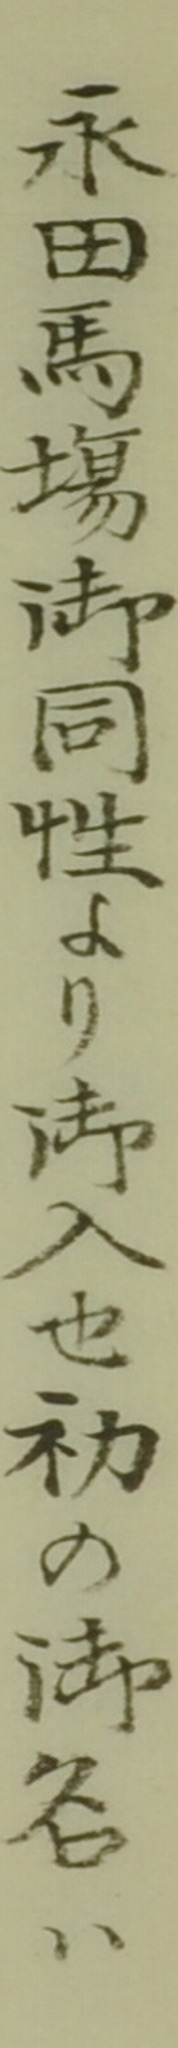永田馬場御同性より御入也初の御名は
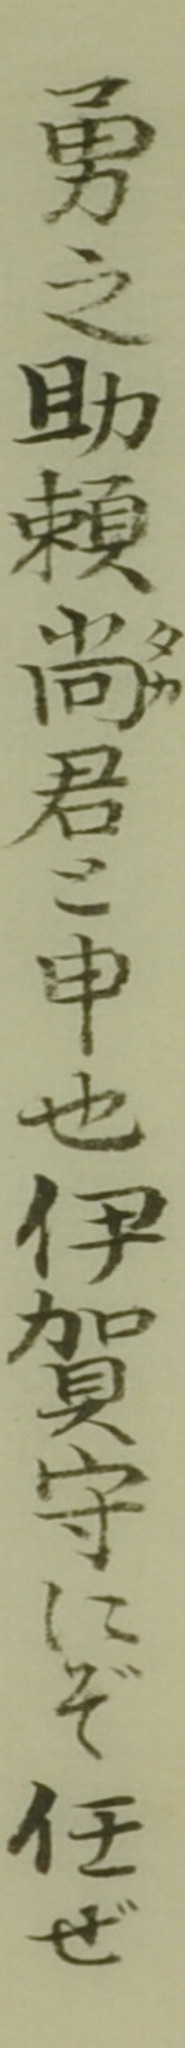勇之助頼尚君と申也伊賀守にぞ任ぜ
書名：藤葛（全）
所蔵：伊那市立高遠町図書館・合同会社AMANE
